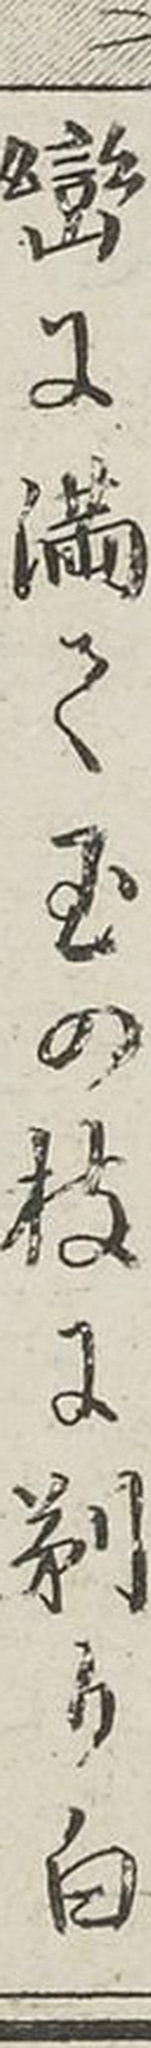巒に満て玉の枝に剃り白
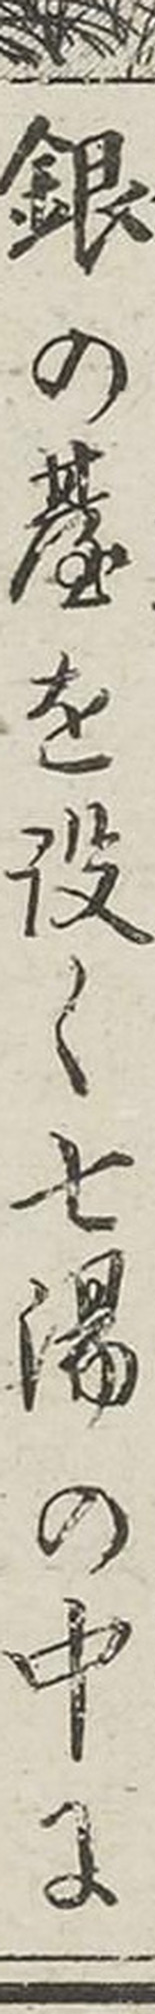銀の臺を？く七湯の中に
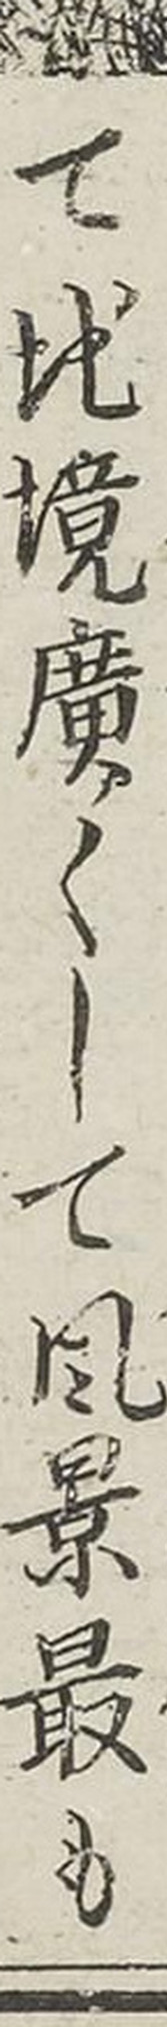て地境広くして風景最も
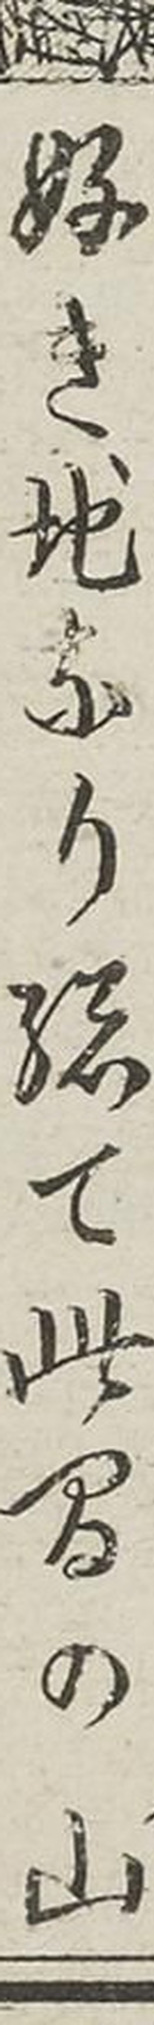好き地なり緒て此間の山
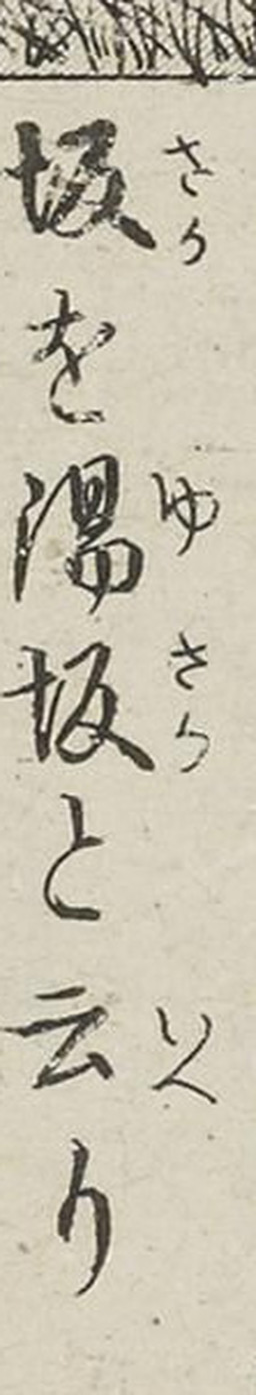坂を湯坂と云り
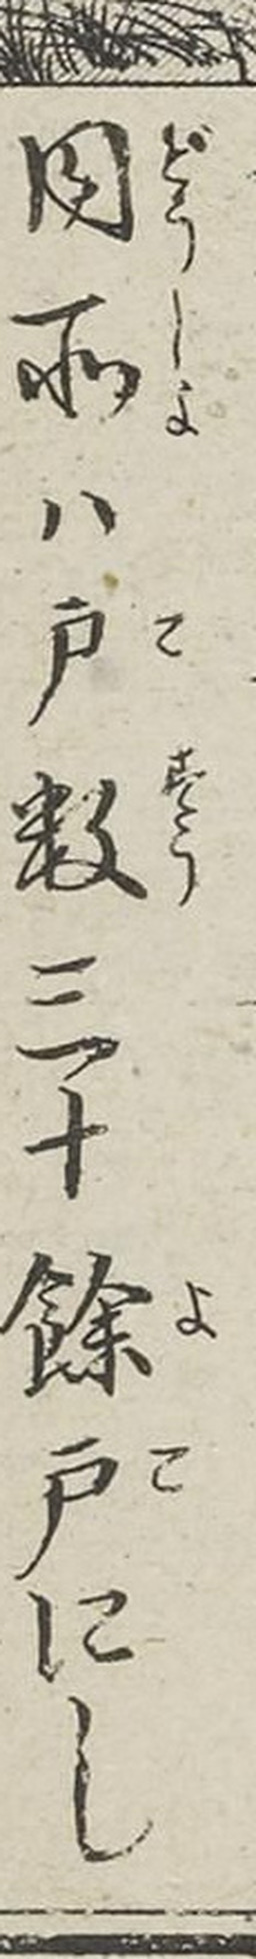同所は戸数三十余戸にし

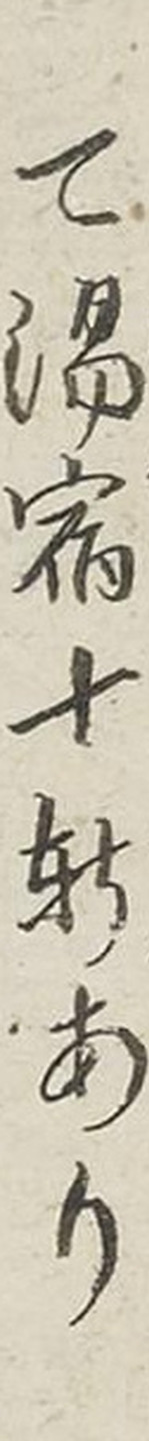て湯宿十軒あり
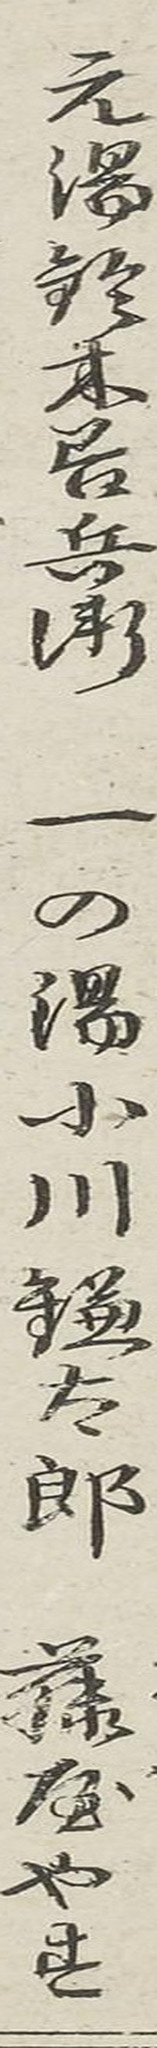元湯鈴木善兵衛一の湯小川鎌太郎藤屋やす
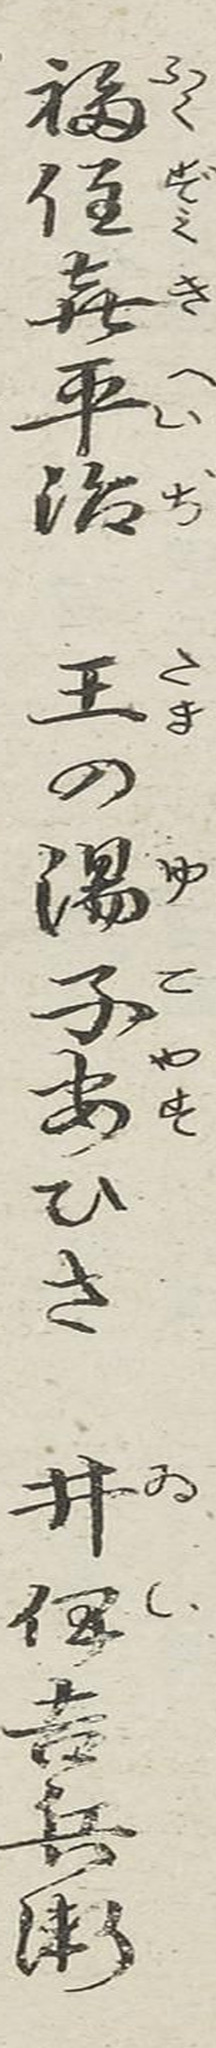福住喜平冶玉の湯子安ひさ井伊吉兵衛
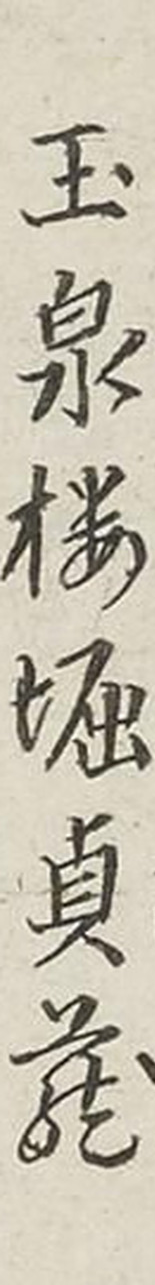玉泉楼堀貞蔵
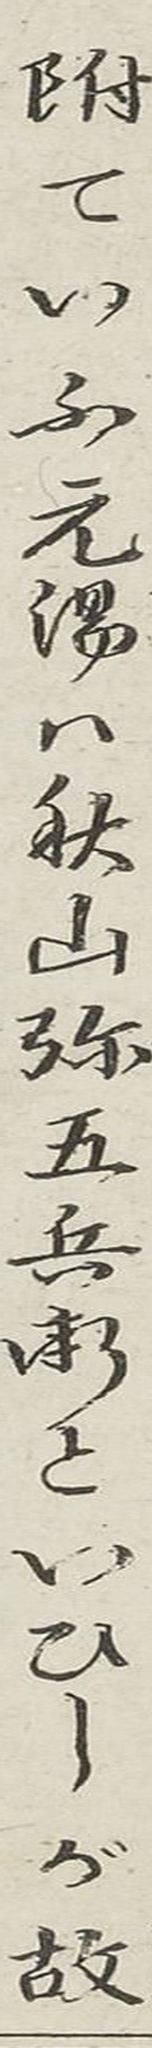附ていふ元湯は秋山弥五兵衛といひしが故
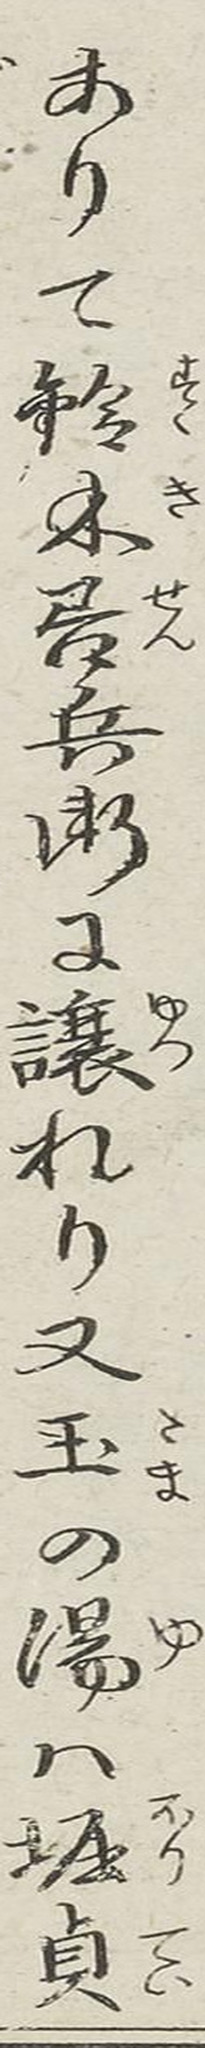ありて鈴木善兵衛に譲れり又玉の湯は堀貞
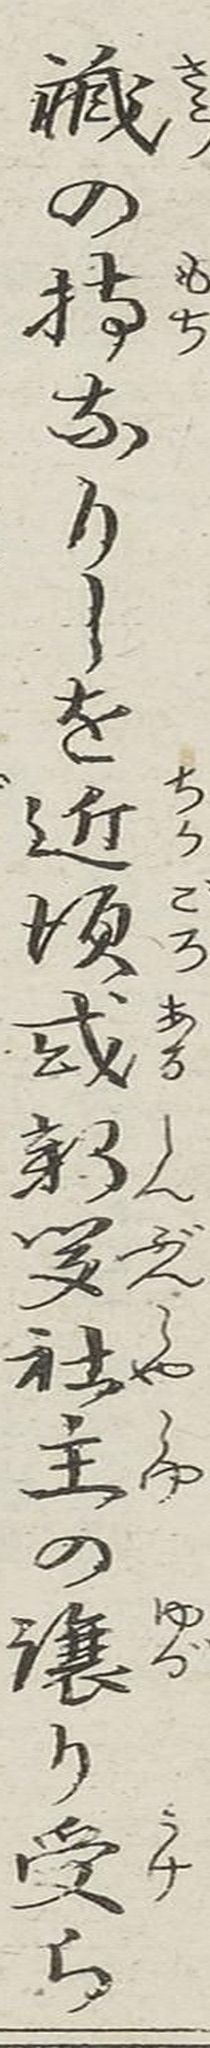蔵の持なりしを近頃或新聞社主の譲り受ら
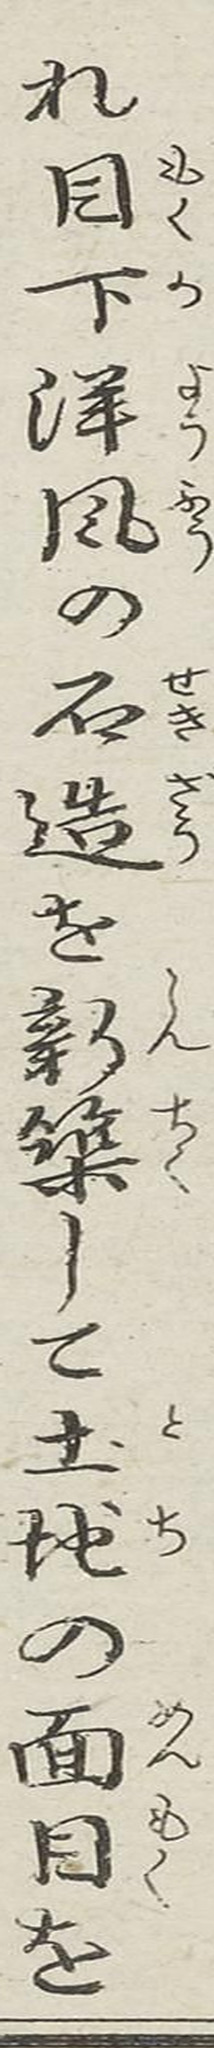れ目下洋風の石造を新築して土地の面目を
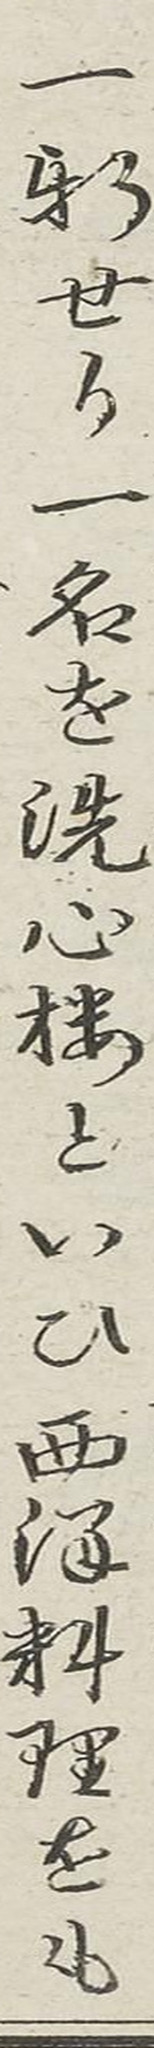一新せり一名を洗心楼といひ西洋料理をも
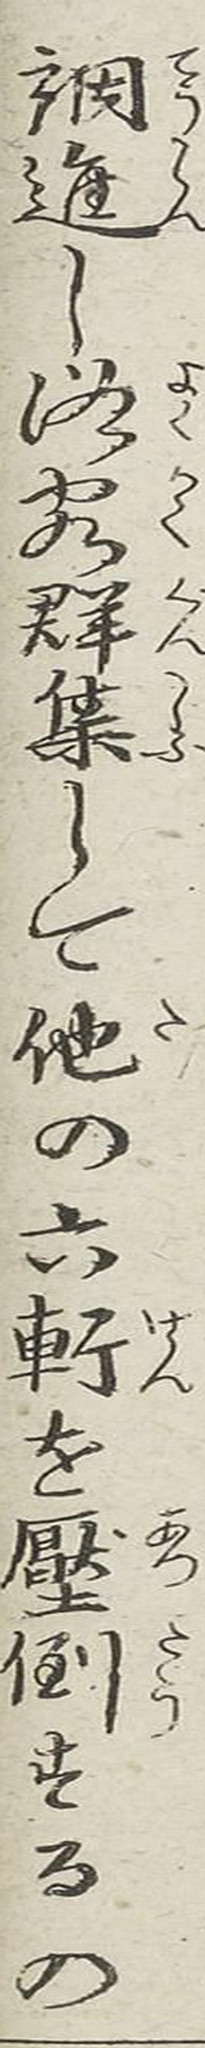調進し浴客群集して他の六軒を圧倒するの
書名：箱根温泉誌　全
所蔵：東京大学地震研究所図書室 Earthquake Research Institute Library, The University of Tokyo, JAPAN
